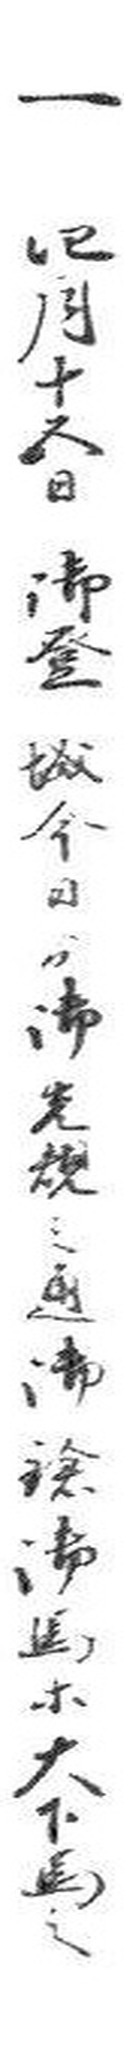一四月十五日御登城今日ゟ御先規之通御鎗御馬等大下馬之
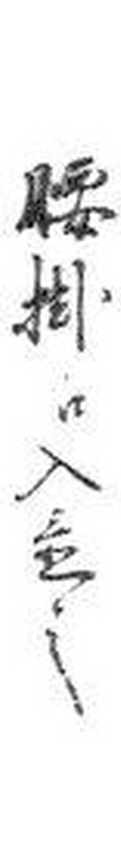腰掛江入置之
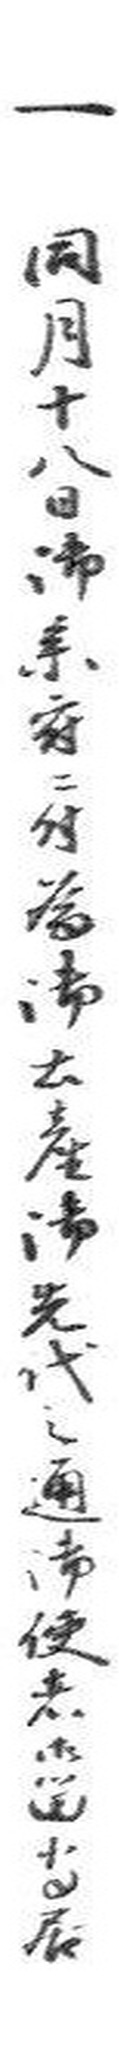一同月十八日御参府ニ付為御土産御先代之通御使者御留守居
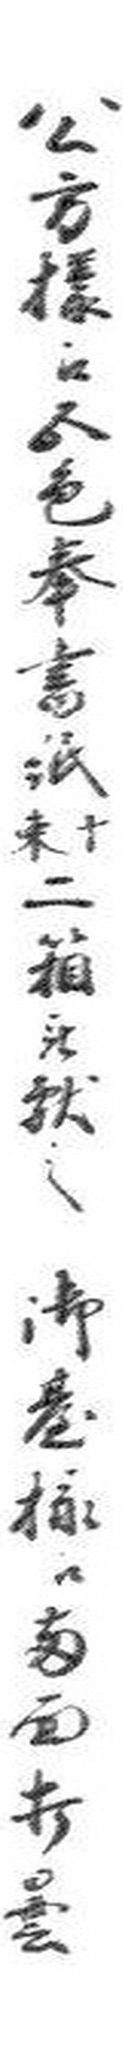公方様江五色奉書紙十束二箱被献之御台様江両面打雲
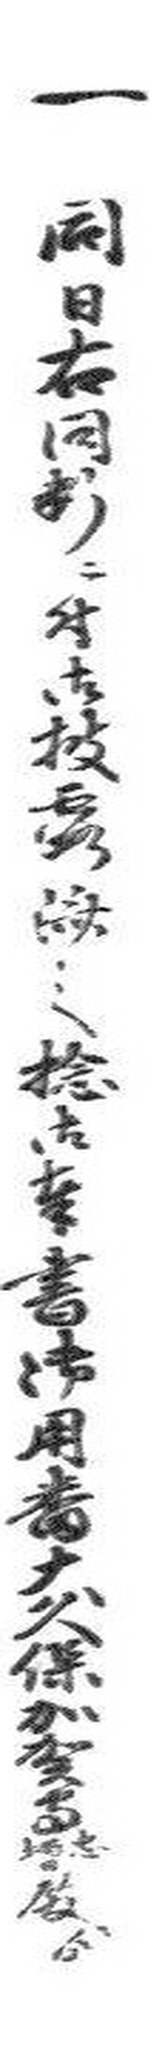一同日右同断ニ付御披露済之捻御奉書御用番大久保加賀守忠増殿ゟ
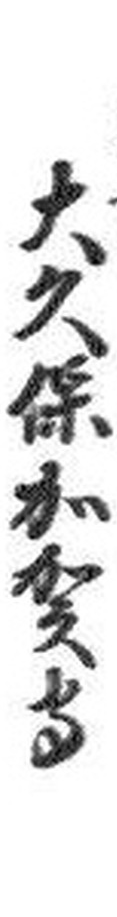大久保加賀守
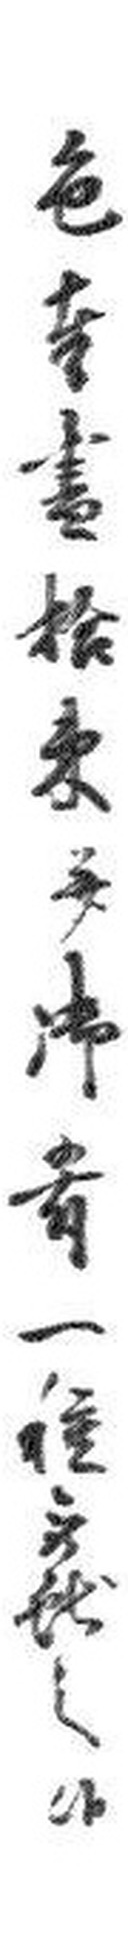色奉書拾束并御肴一種被献之候
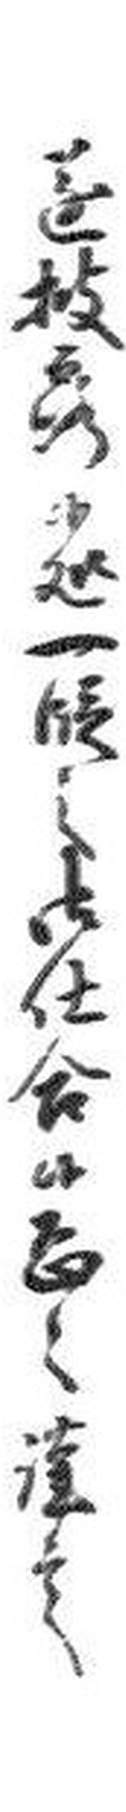遂披露候処一段之御仕合候恐々謹言

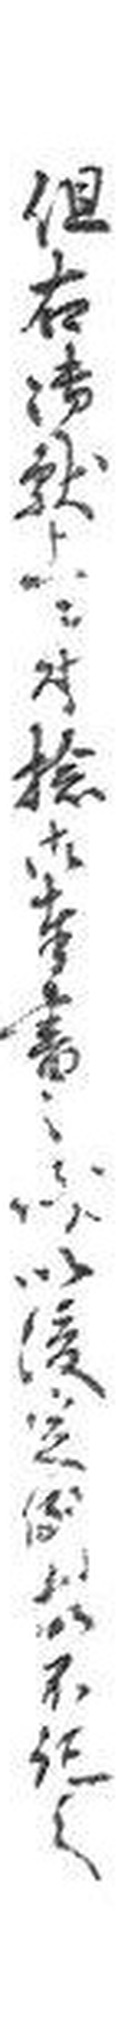但右御献上ニ付捻御奉書之儀以後定例故不記之
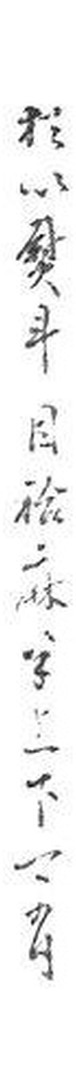猶以熨斗目袷麻半上下可有
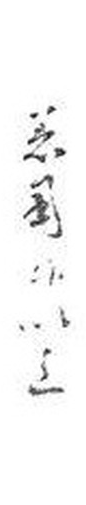着用候以上
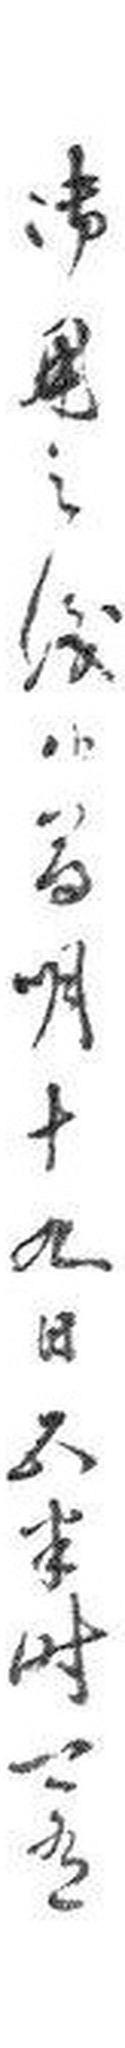御用之儀候間明十九日五半時可有
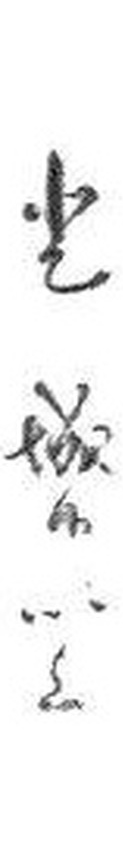登城候以上
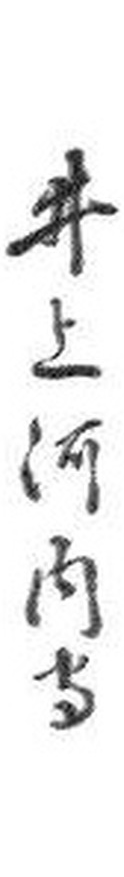井上河内守
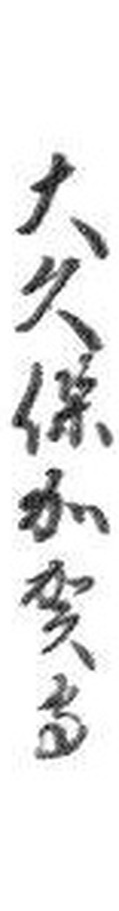大久保加賀守
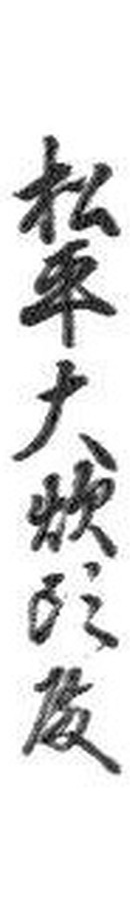松平大炊頭殿
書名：家譜 二十九 吉邦公 従正徳二年到正徳三年
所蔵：福井県文書館 Fukui Prefectural Archives
